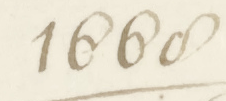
1668
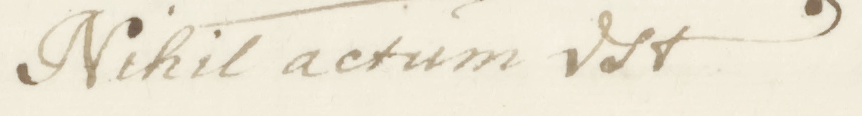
Nihil actum est
